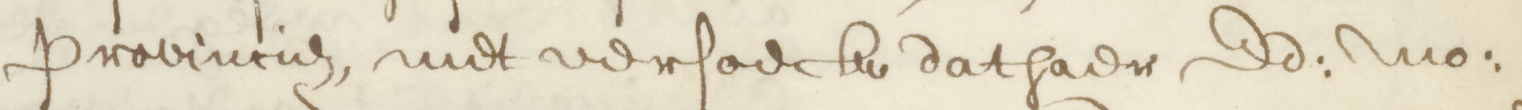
provincien, met versoeck dat haer Ed:Mo:
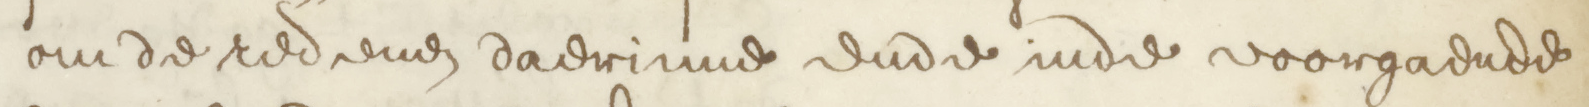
om de redenen daerinne ende inde voorgaende
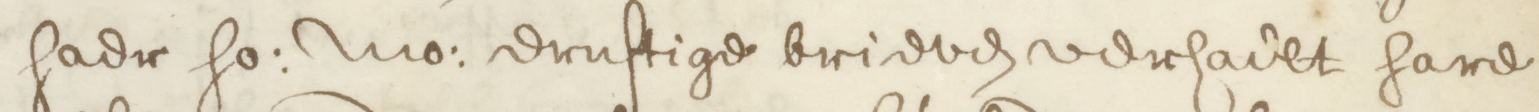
haer Ho:Mo: ernstige brieven verhaelt hare
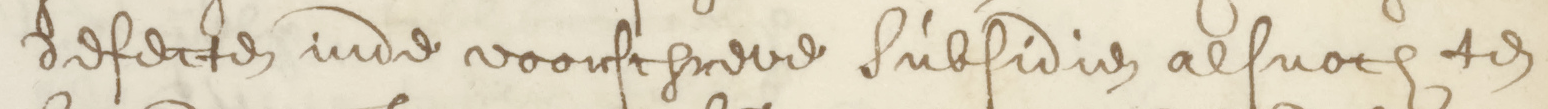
defecten inde voorschreve subsidien alsnoch ten
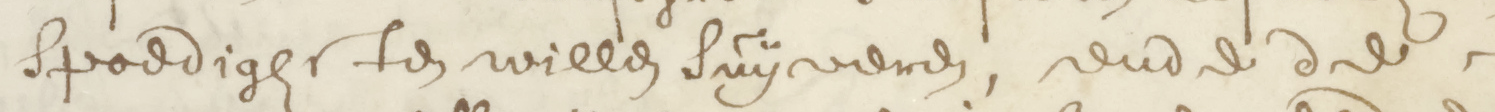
spoedighsten willen suijveren, ende de
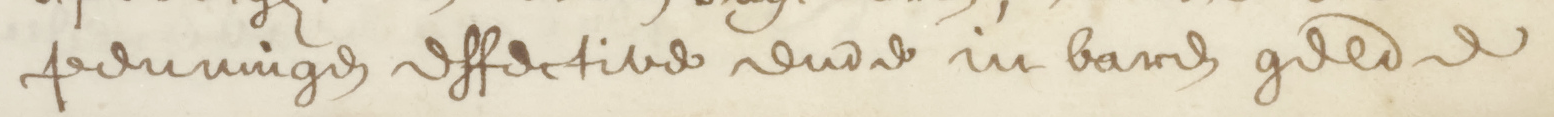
penningen effective ende in baren gelde
